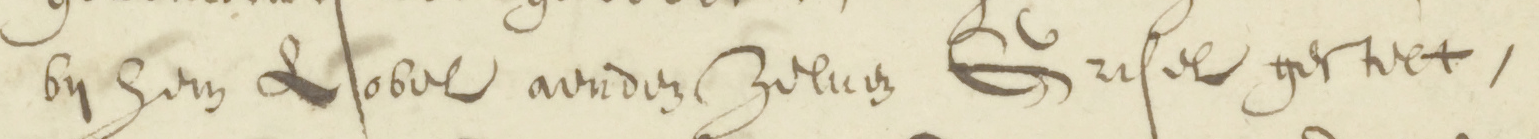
by hem Lobel aenden zeluen Grisel gestelt,
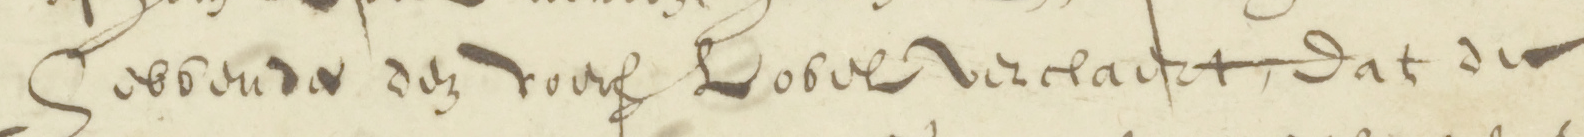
hebbende den voers Lobel verclaert, dat de
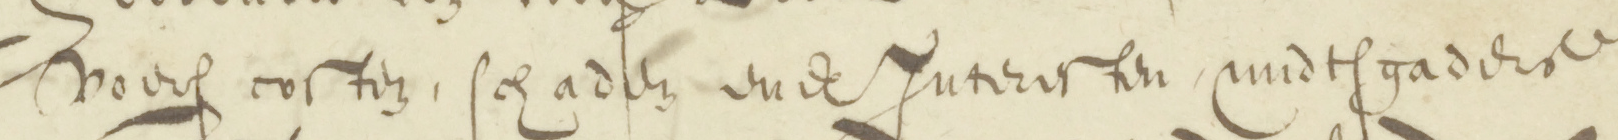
voers costen, schaden ende Interesten midtsgaders
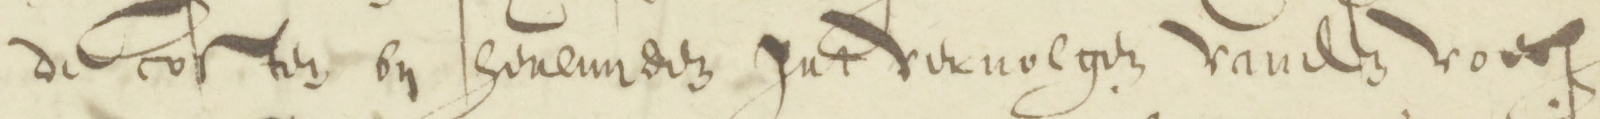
de costen by henluyden Int veruolgen vanden voers
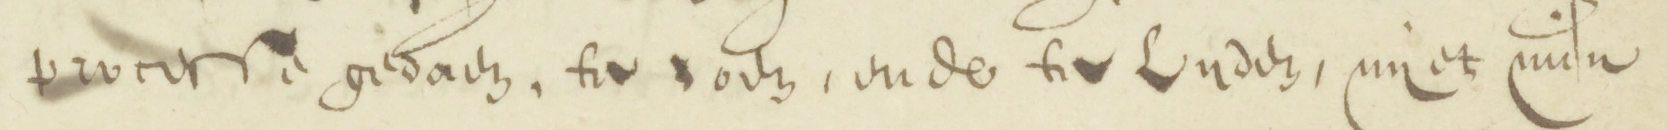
processe gedaen, te doen, ende te lyden, nijet min
